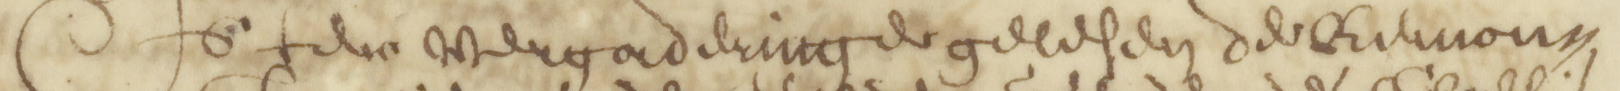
Is ter Vergaderinge gelesen de Remon„
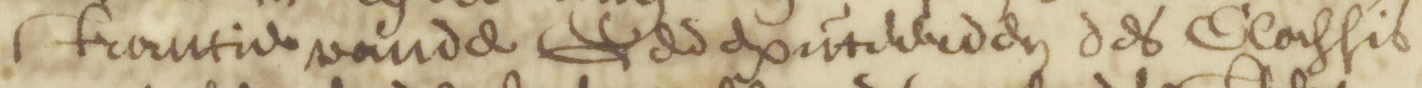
strantie vande Gedeputeerden des Classis
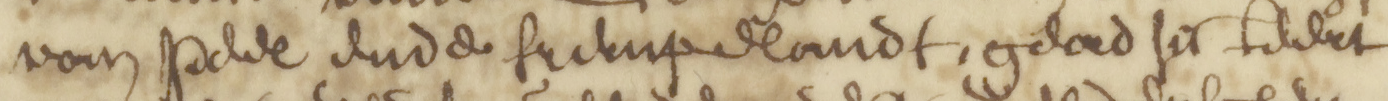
van Peel ende kempelandt, geadsisteert
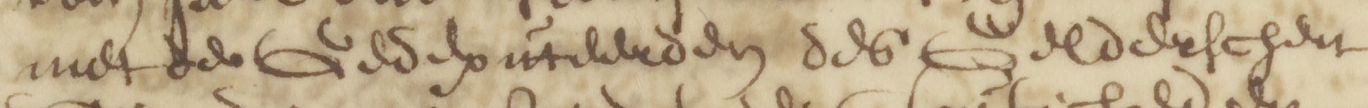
met de Gedeputeerden des Gelderschen
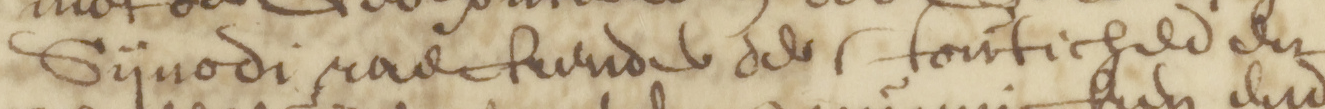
Sijnodi, raeckende de stouticheden
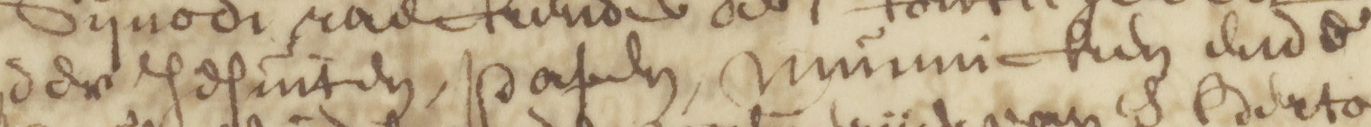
der Jesuiten, Papen, Munnicken ende
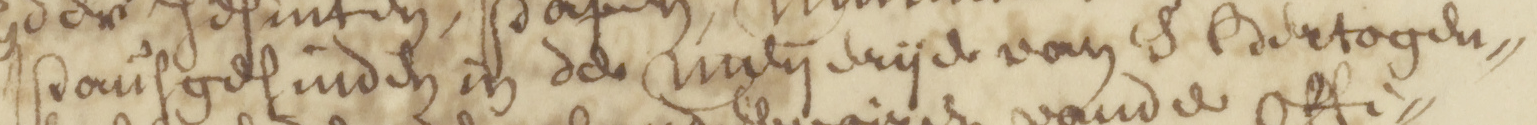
Pausgesinden in de meijerije van ‛s Hertogen„
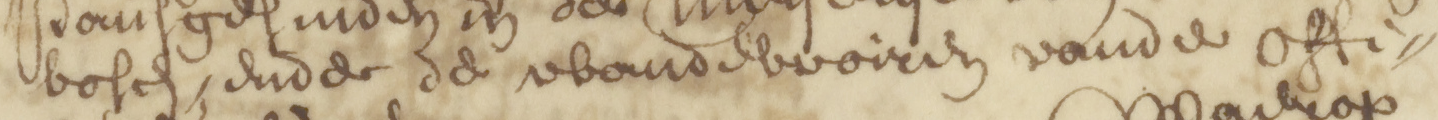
bosch, ende de wandebvoiren vande offe„
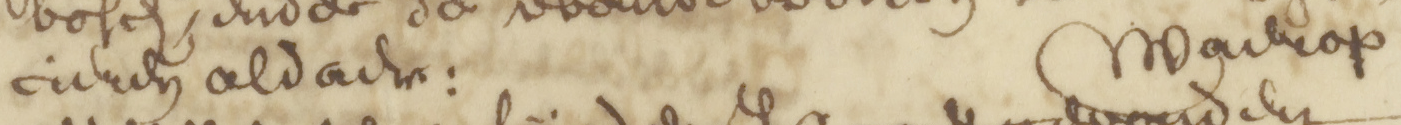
cieren aldaer: Waerop
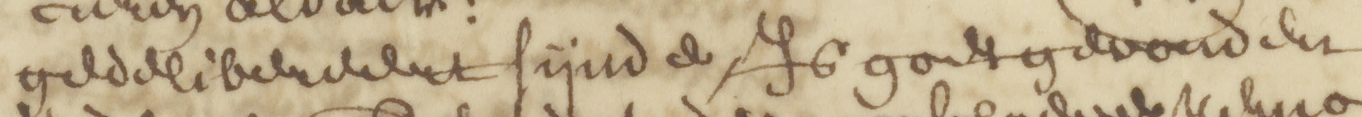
gedelibereert sijnde, Is goetgevonden
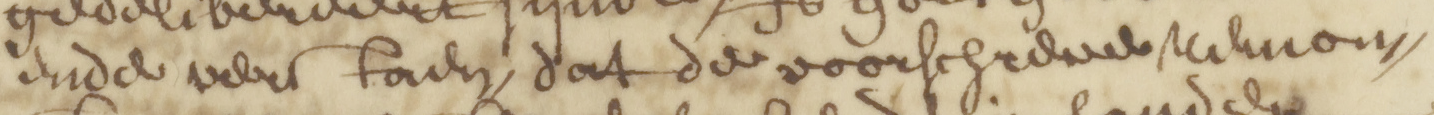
ende verstaen, dat de voorschreve remon„
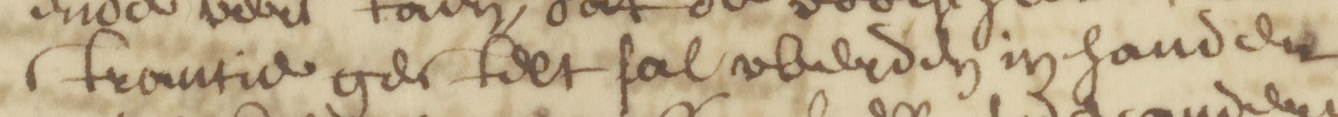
strantie gestelt sal werden in handen
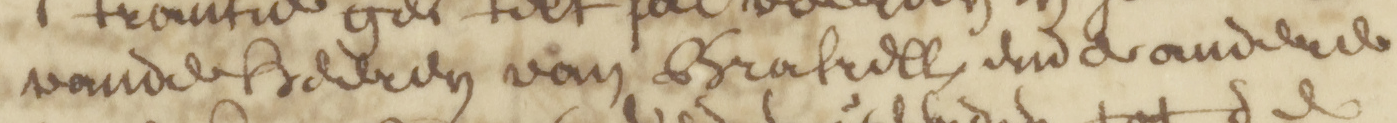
vande Heeren van Brakell, ende andere
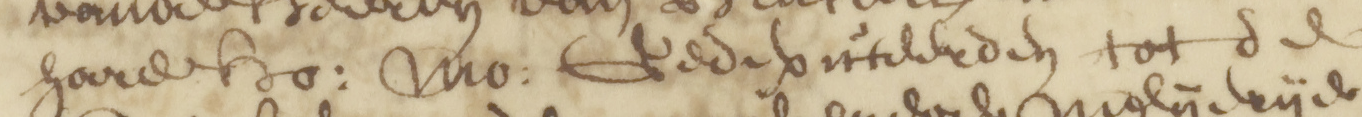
hare Ho:Mo: Gedeputeerden tot de
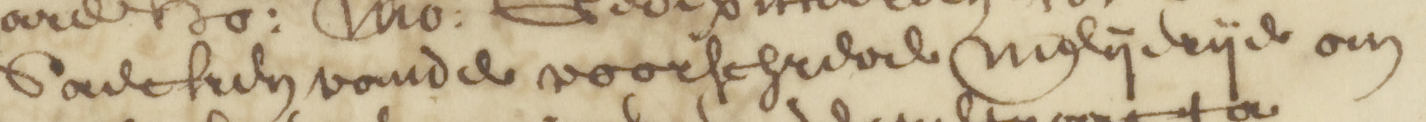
Saecken vande voorschreve Meijerije om
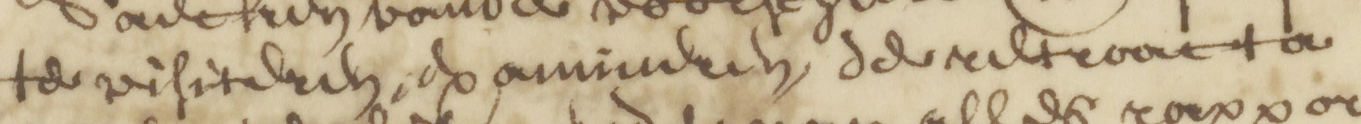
te visiteren, examineren, de retroacta
